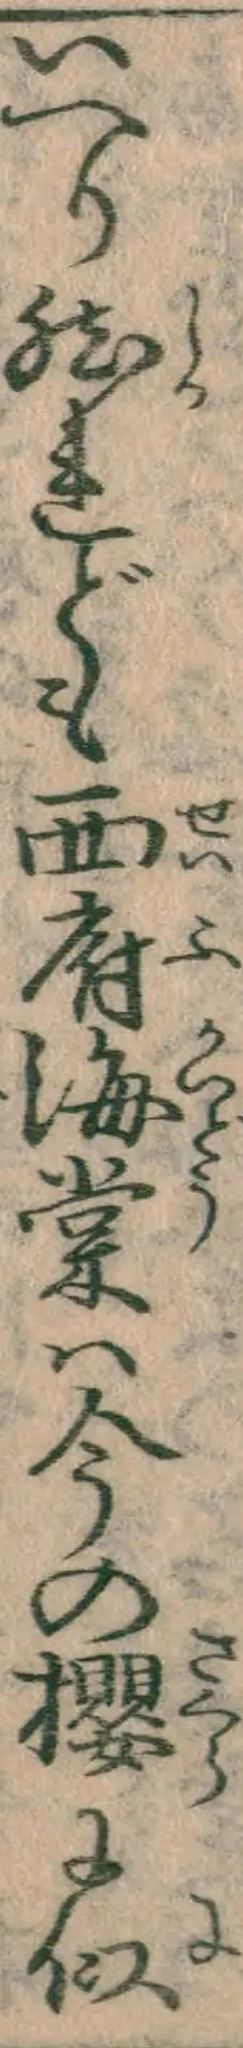いへり然れども西府海棠は今の桜に似
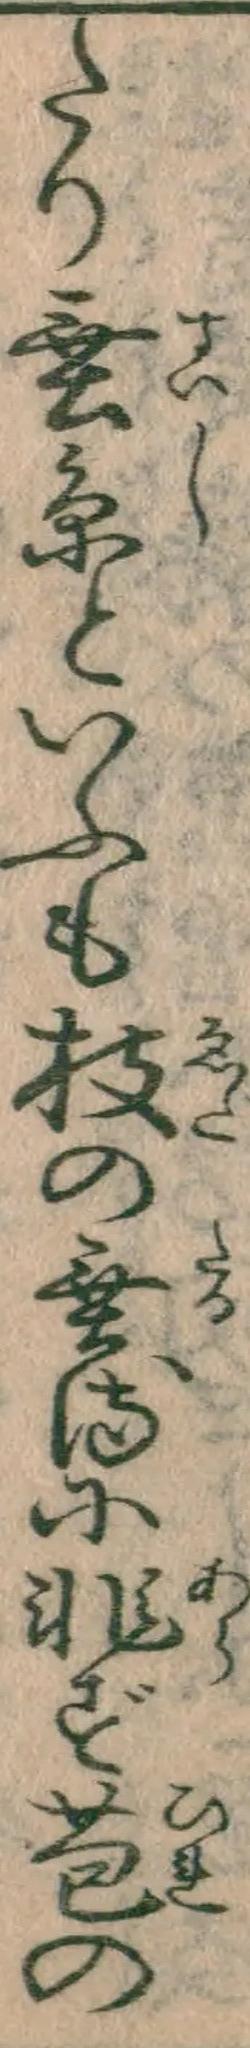たり垂糸といふも枝の垂るに非ず苞の
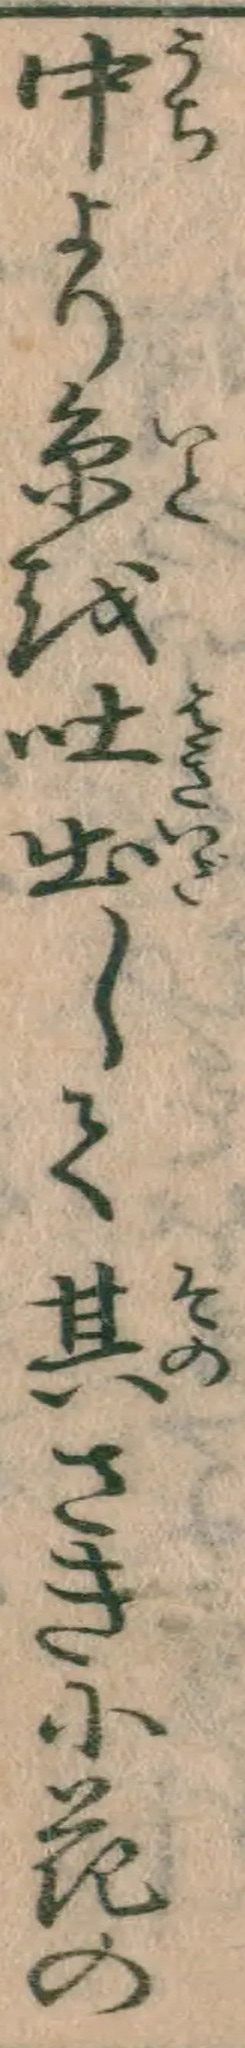中より糸を吐出して其さきに花の
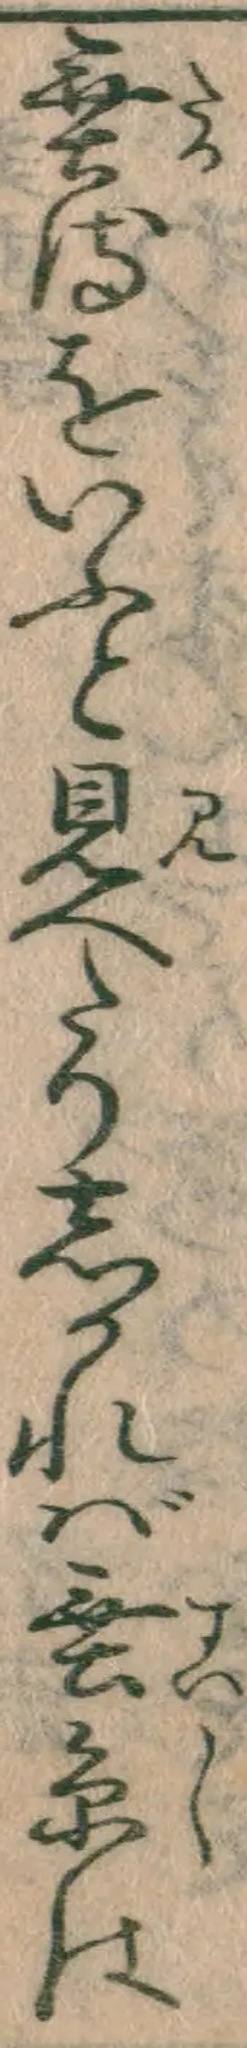垂るをいふと見へたりしかれば垂糸は
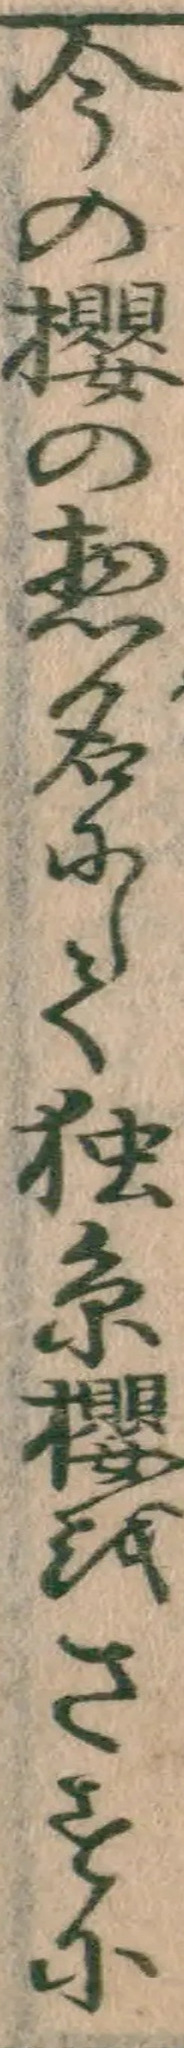今の桜の惣名にして独糸桜をさすに
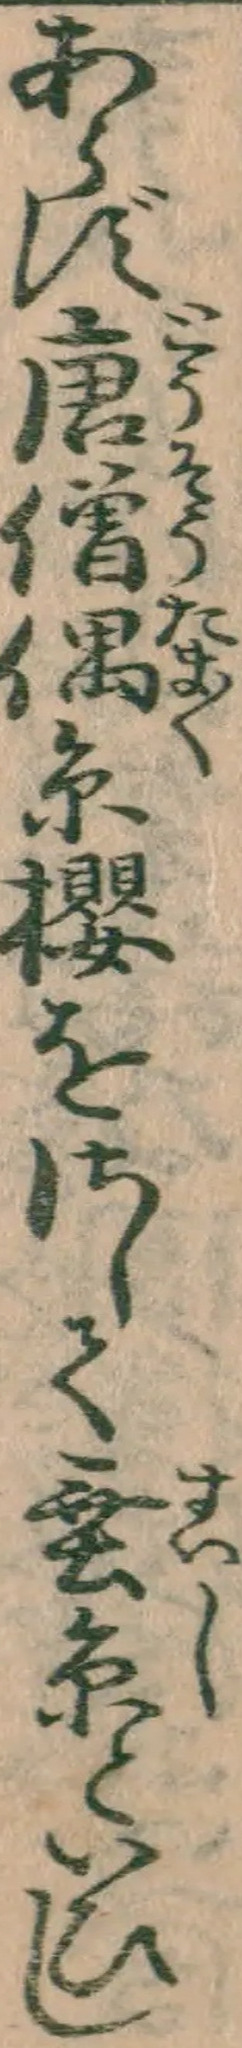あらず唐僧偶糸桜をさして垂糸といひし
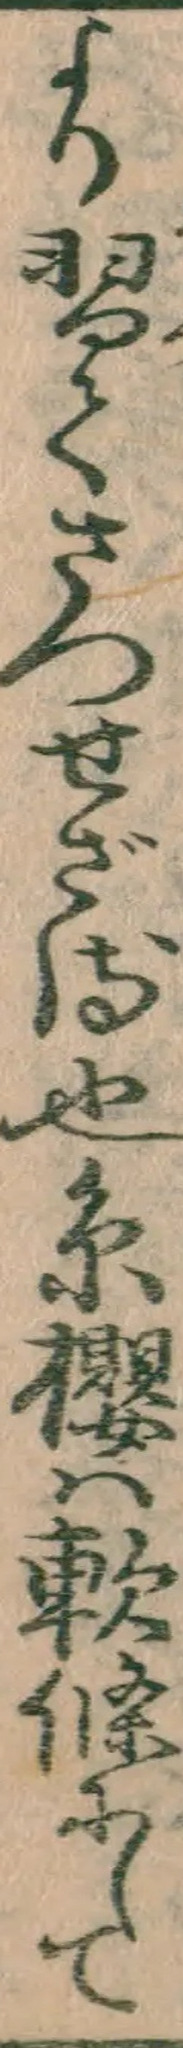より習てさつせざる也糸桜は軟條にして
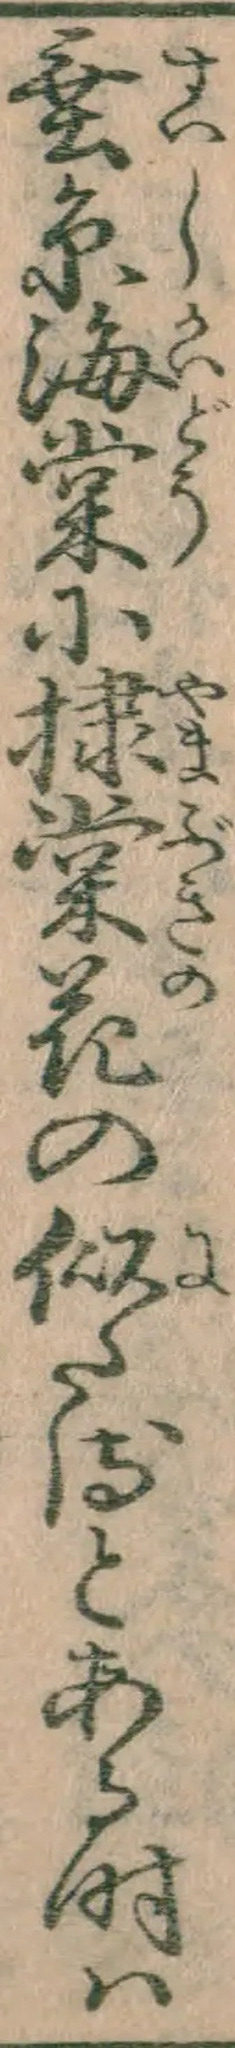垂糸海棠に捸棠花の似たるとある時は
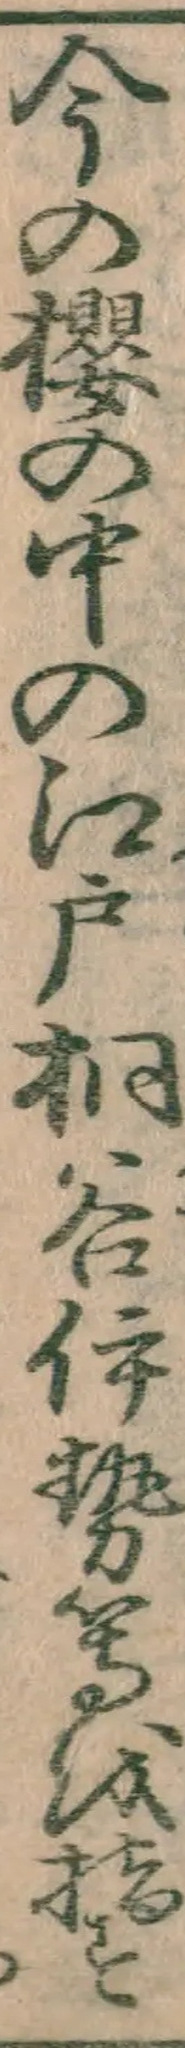今の桜の中の江戸桐谷伊勢等を指す
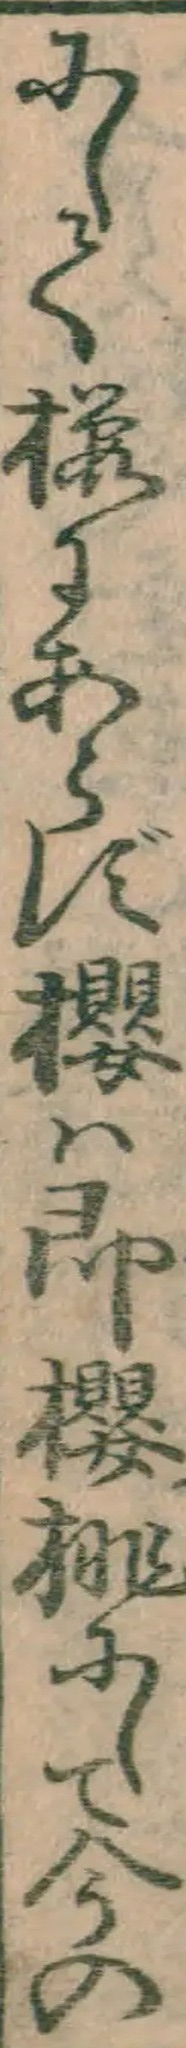にして桜にあらず桜は即桜桃にして今の

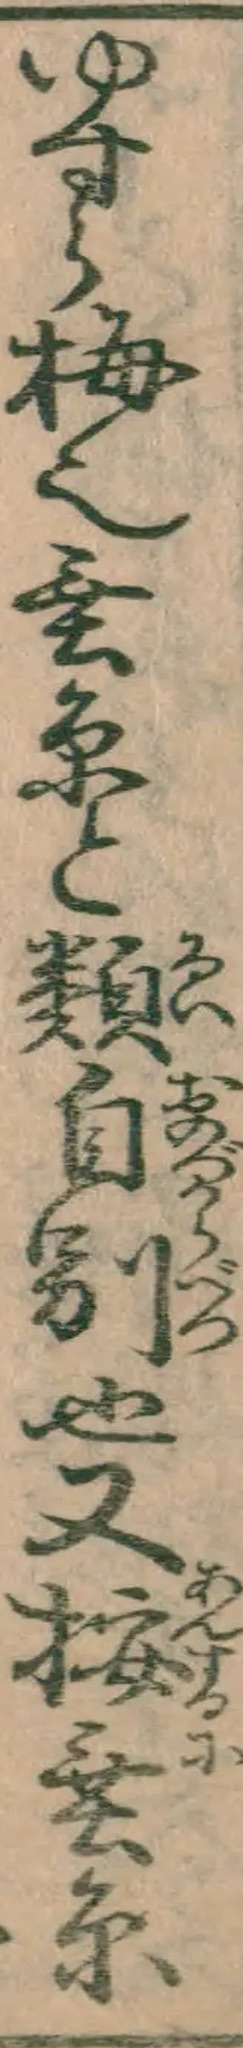ゆすら梅也垂糸と類自別也又按垂糸
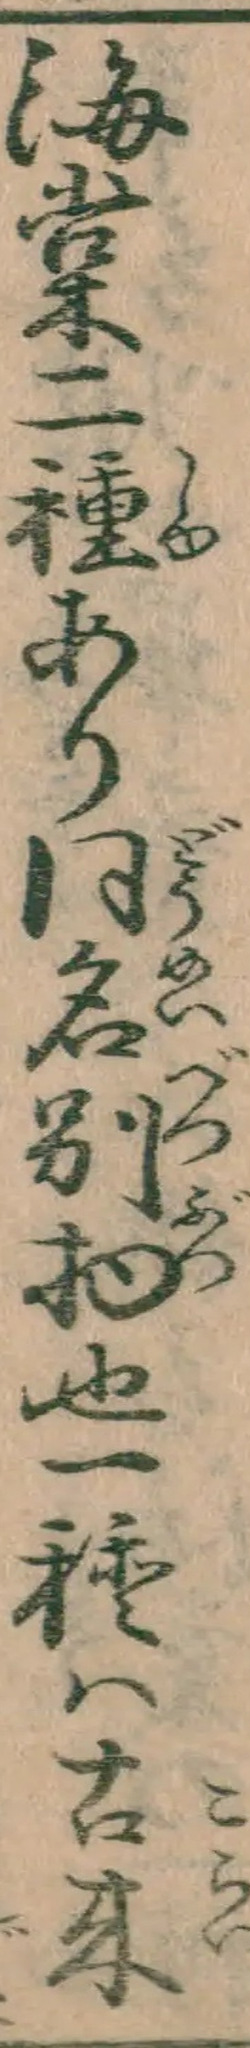海棠二種あり同名別物也一種は古来
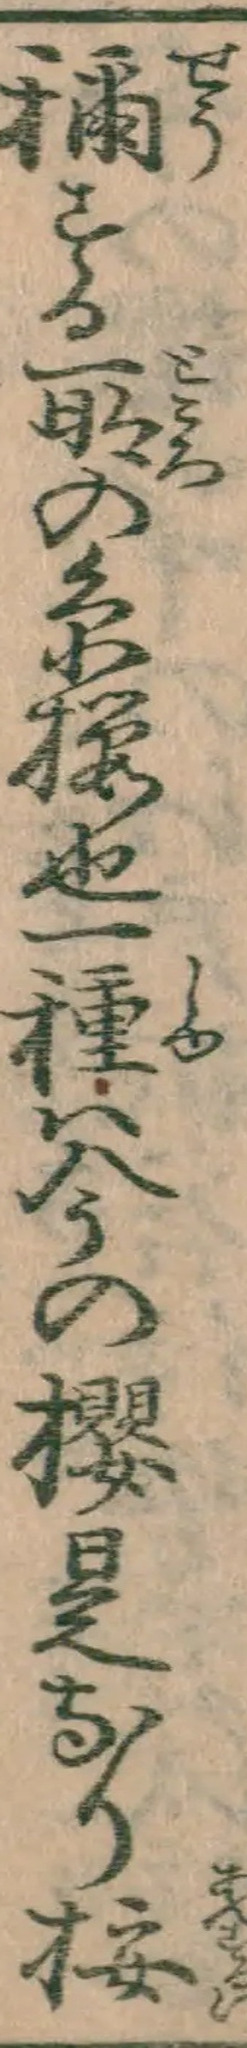称する所の糸桜也一種は今の桜是なり按
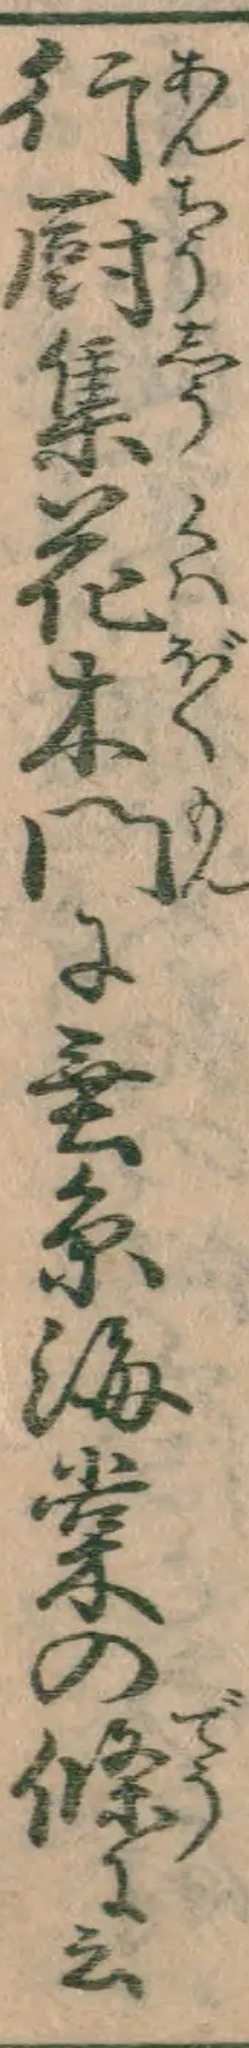行厨集花木門に垂糸海棠の條に云
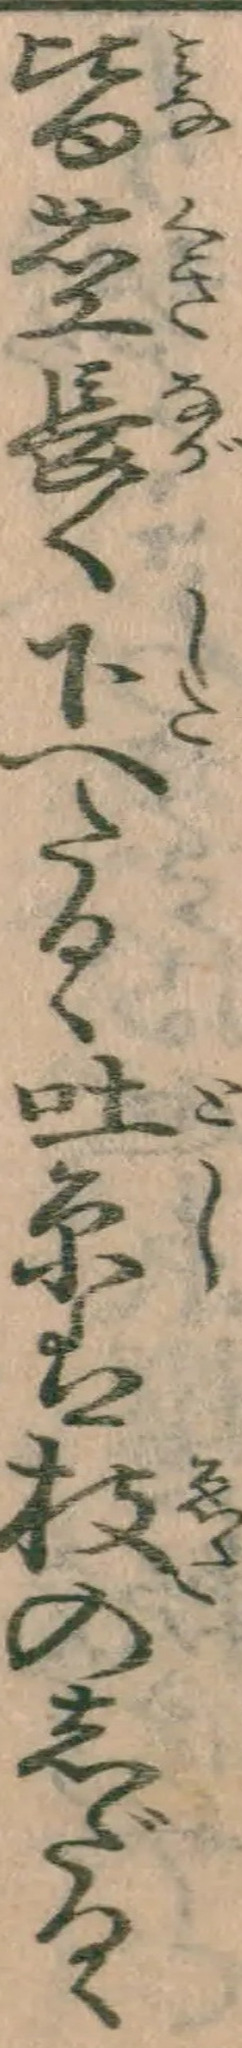皆茎長く下へたるゝ吐糸は枝のしだるゝ
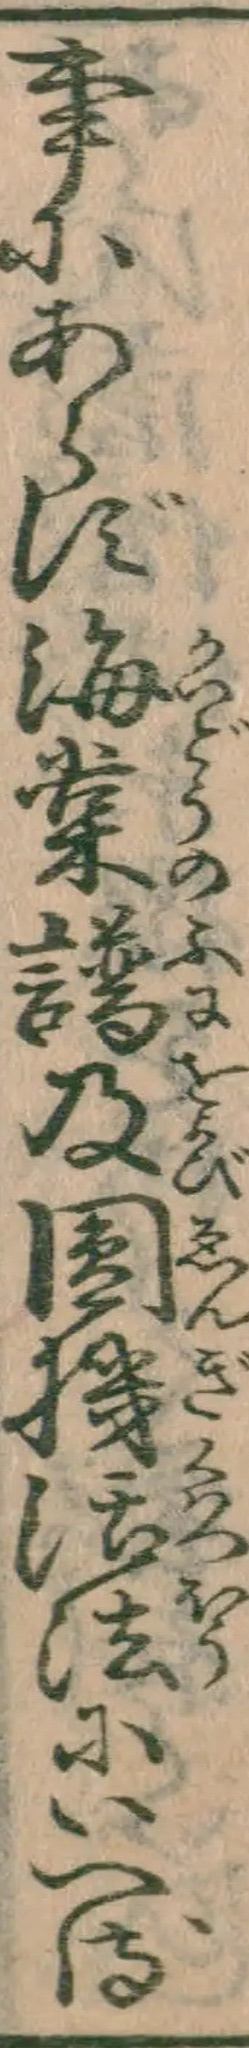事にあらず海棠譜及円機活法にいへる
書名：怡顔齋櫻品
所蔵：国立国会図書館 National Diet Library, JAPAN
